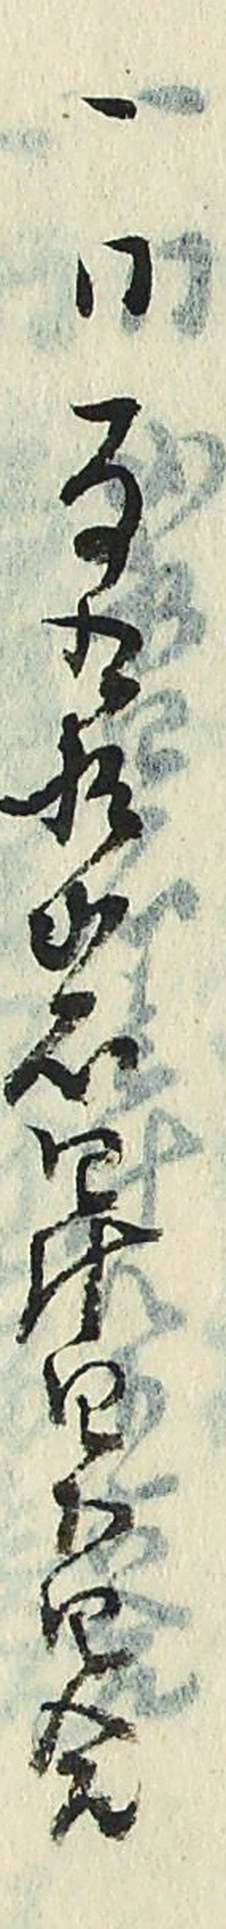一同百九拾弐石四斗四升四合
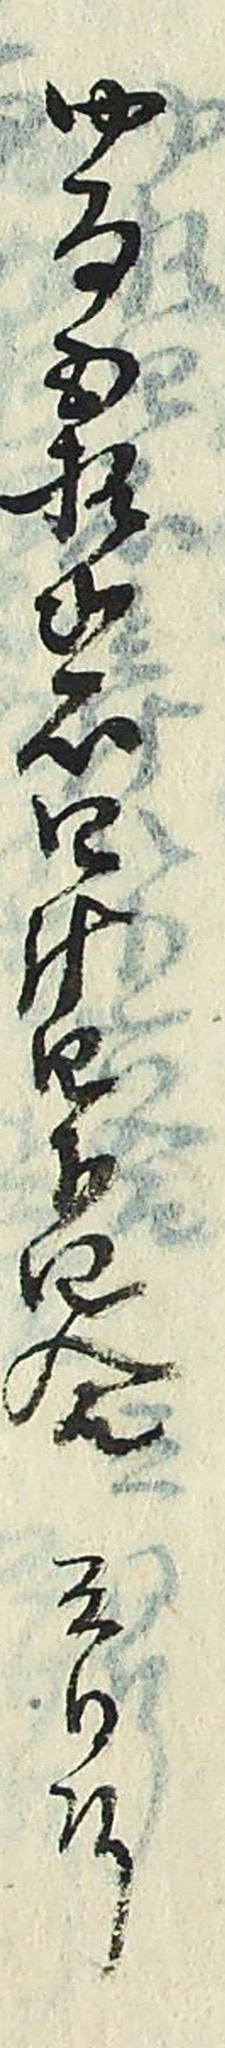内百五拾弐石四斗四升四合右同断
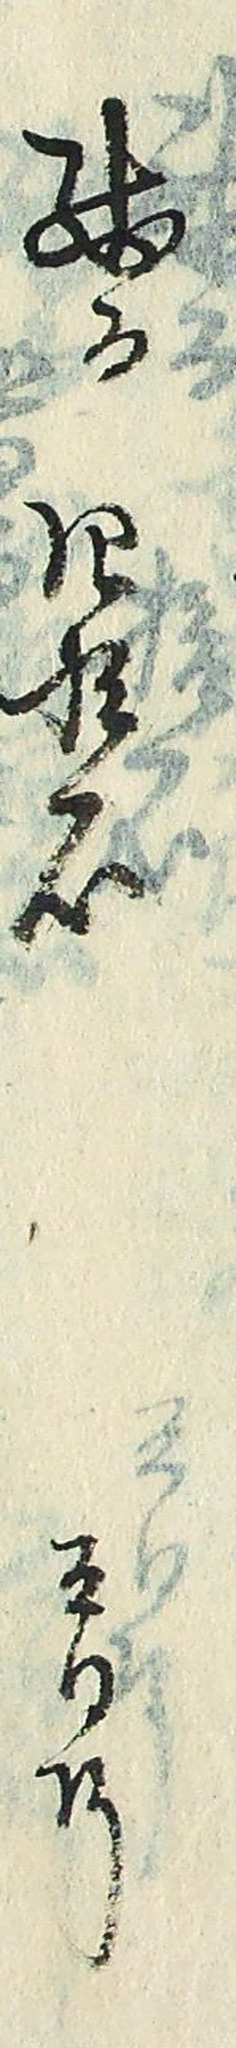残而四拾石右同断
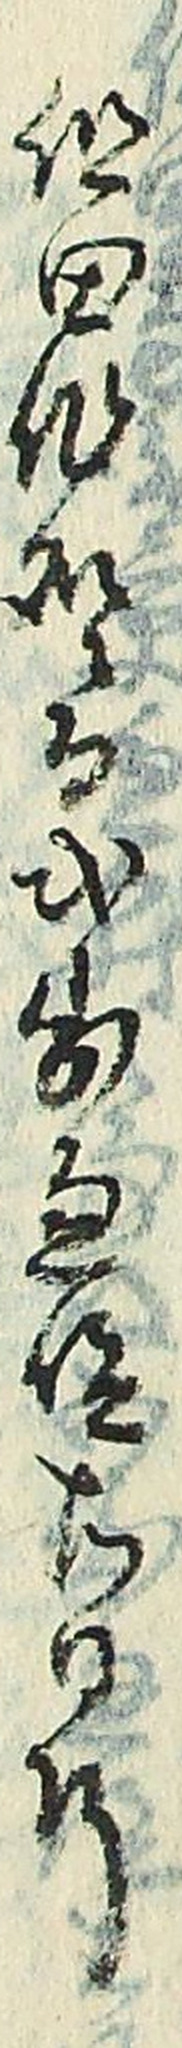但田作処ニ而弐歩通位右同断

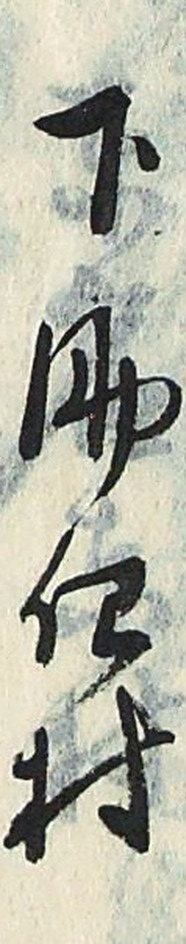下助任村
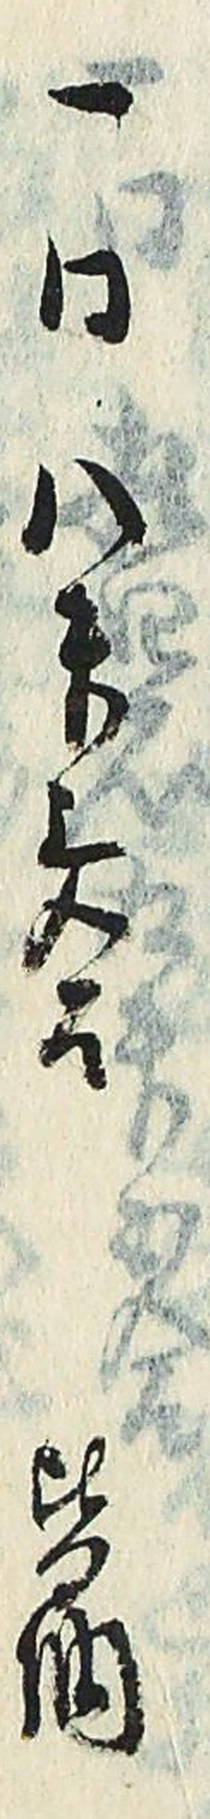一同八升三合皆納
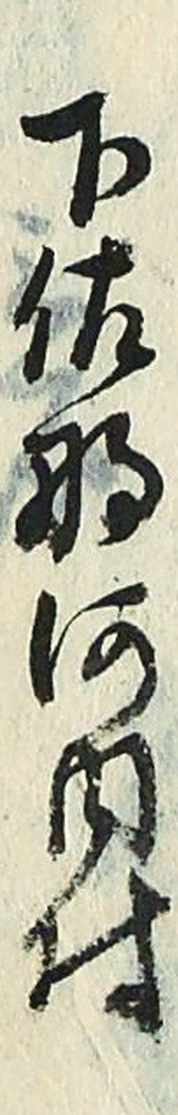下佐那河内村
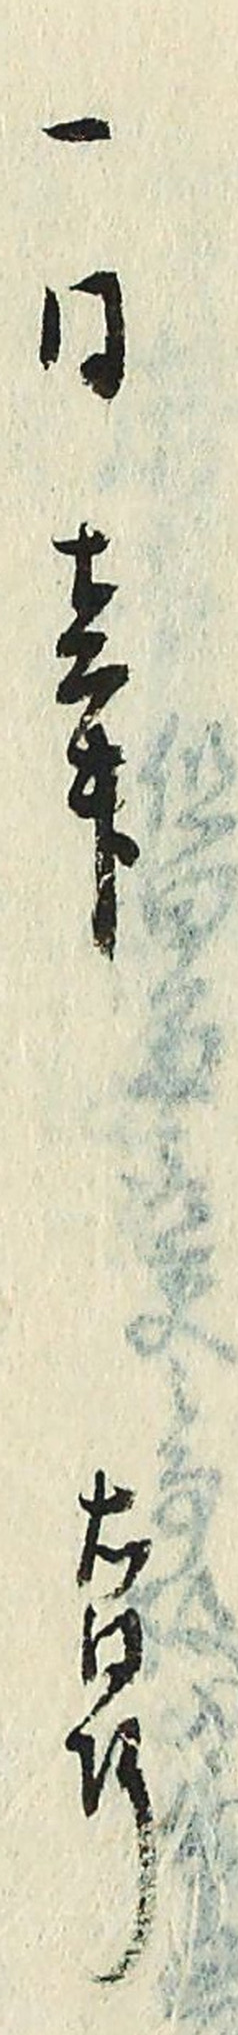一同壱升右同断
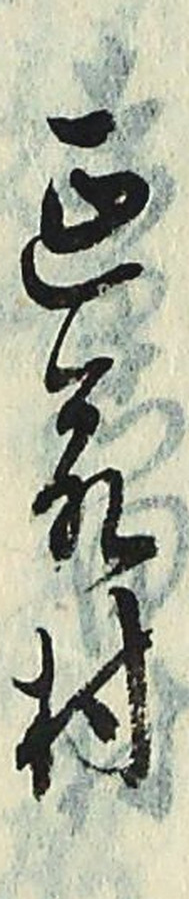延命村
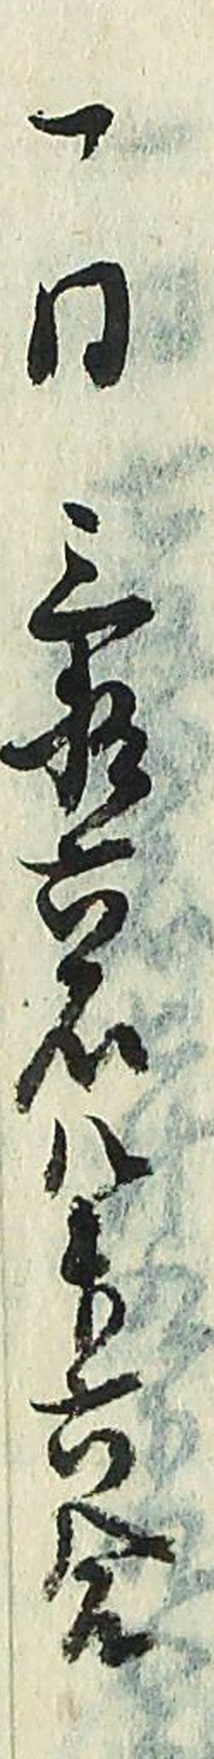一同三拾六石八升六合
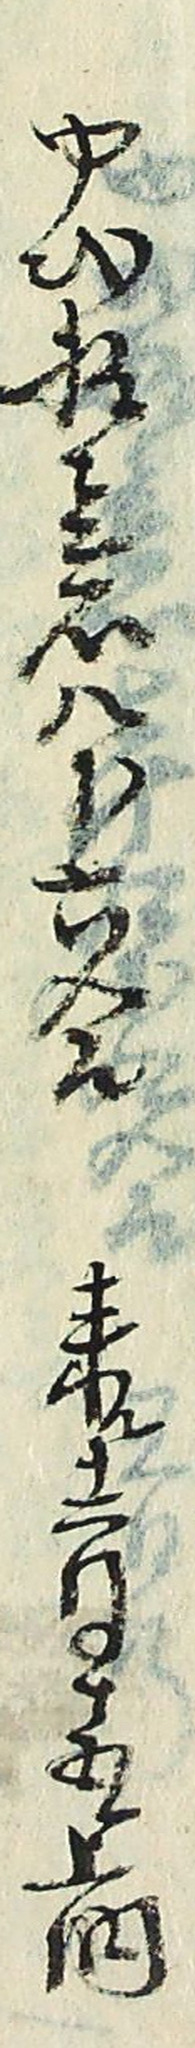内弐拾壱石八升六合来ル十二月十五日上納
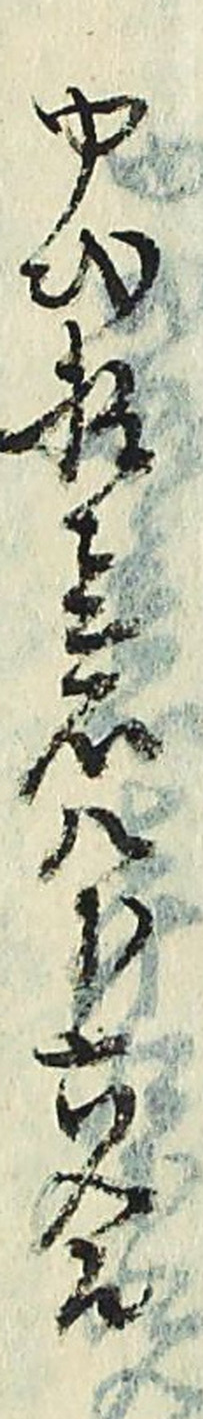一同三拾六石八升六合
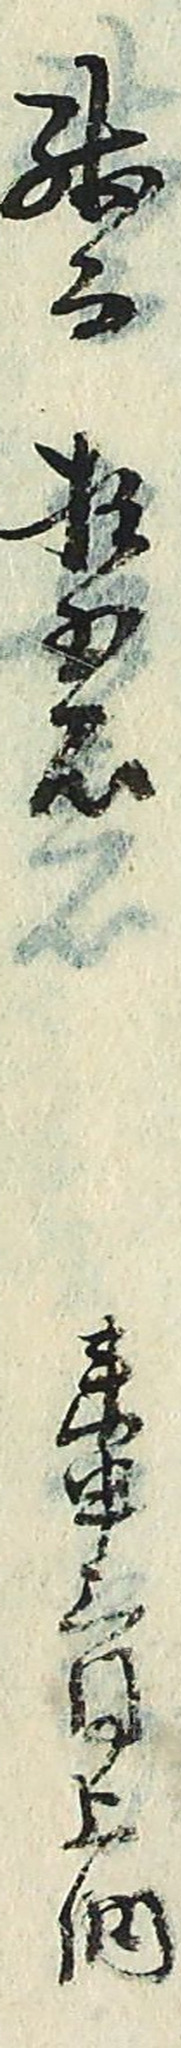残而拾五石来申三月上納
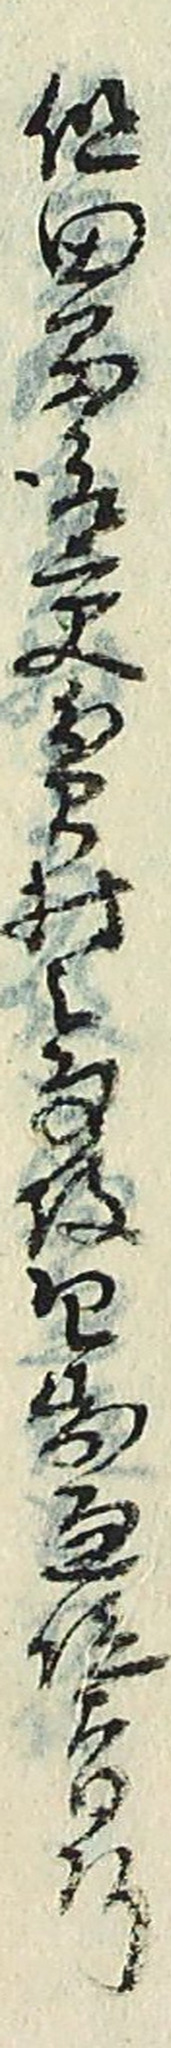但田畠取交貧村之事故四歩通位右同断
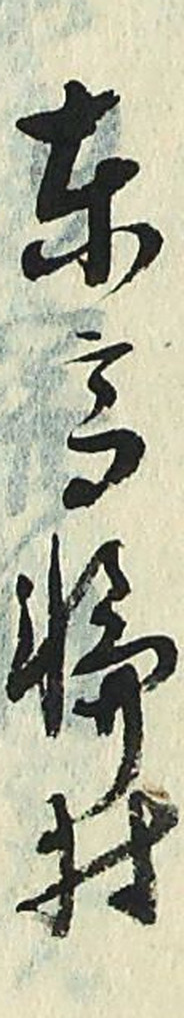東高輪村
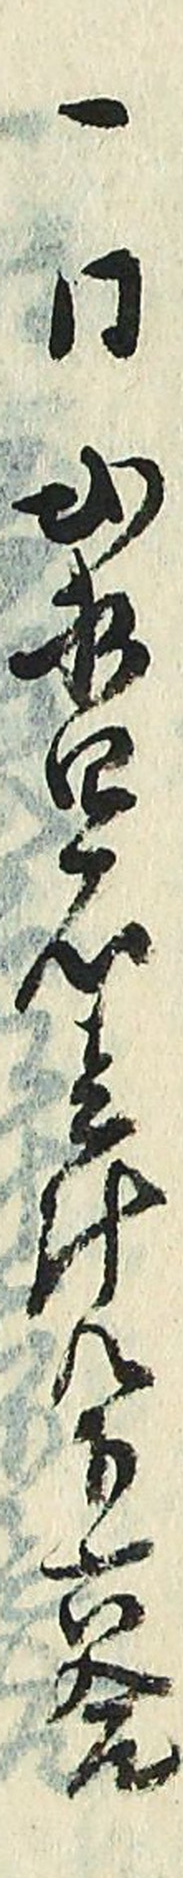一同弐拾四石壱斗八升六合
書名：諸御趣意書并御下知向之写
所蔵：鳴門教育大学 Naruto University of Education
